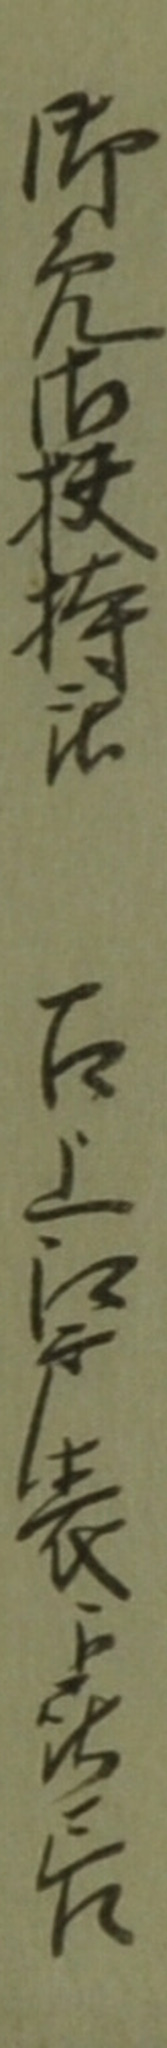御免御扶持被召上江戸表江被差
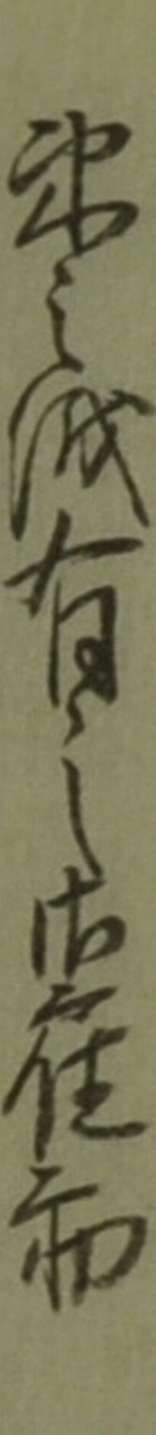束之儀有之御雇勤
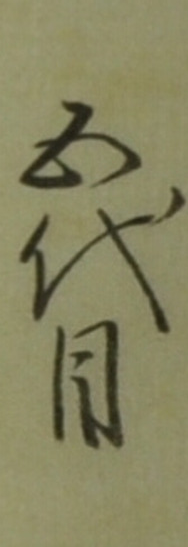五代目

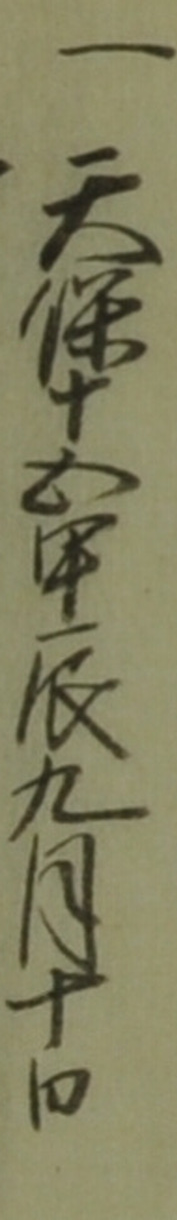一天保十五甲辰九月十日
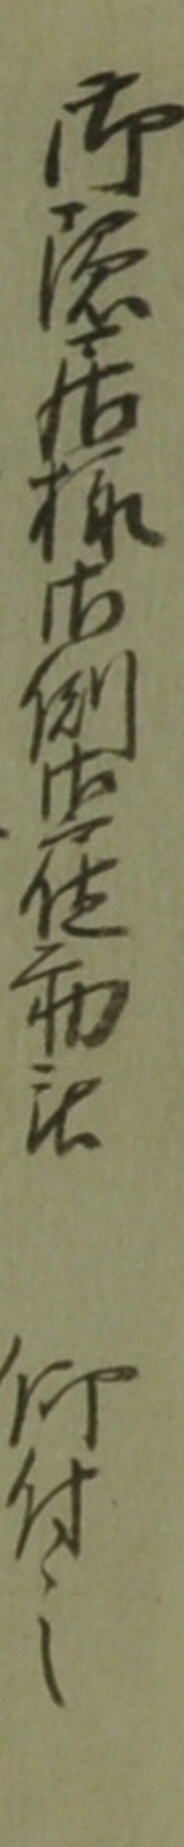御隠居様御側御雇勤被仰付之
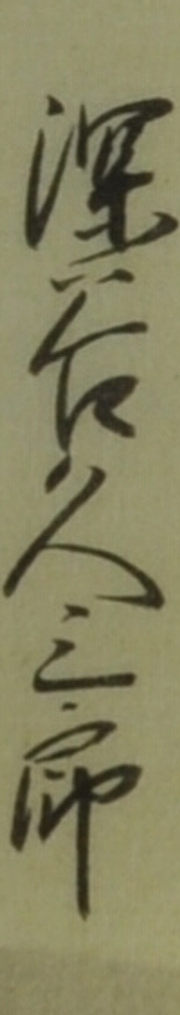深谷久三郎
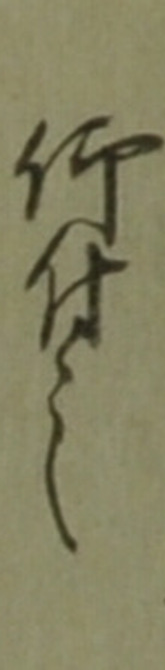仰付之
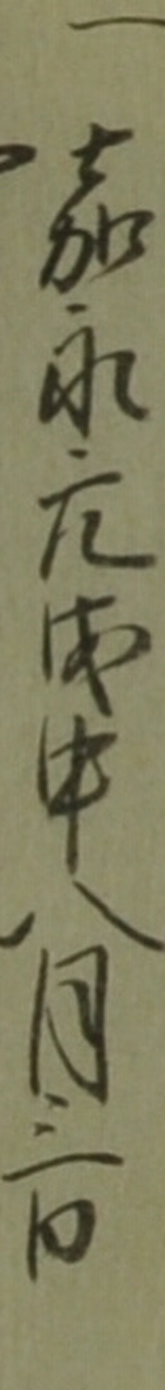一嘉永元戊申八月三日
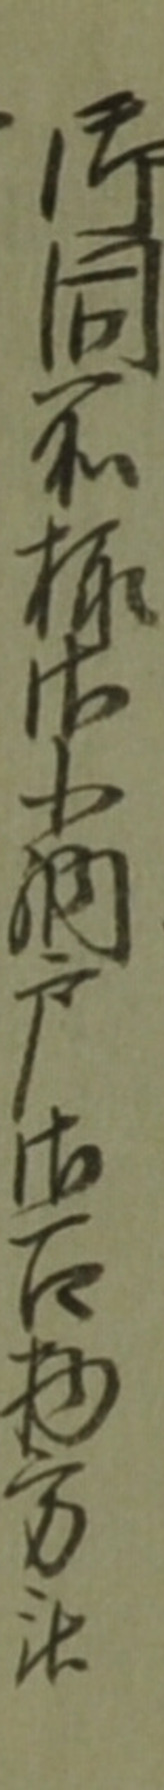御同所様御小納戸御召物方被
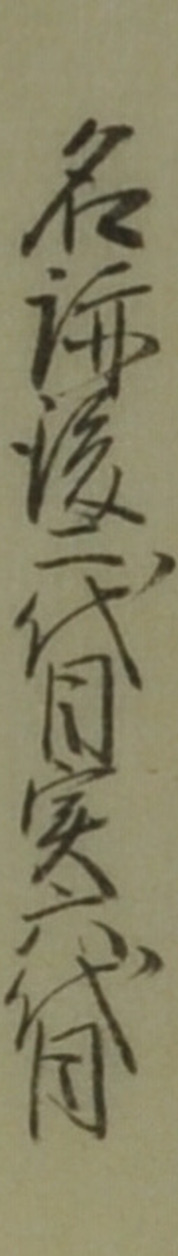名跡後二代目実六代目
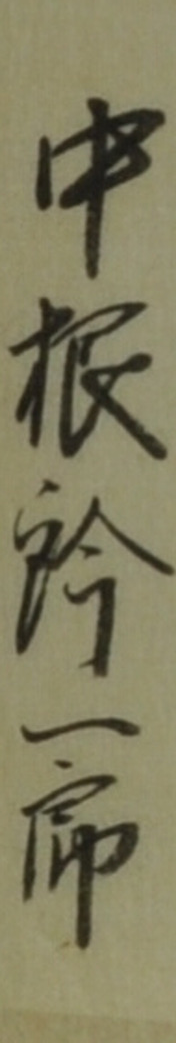中根鈐一郎
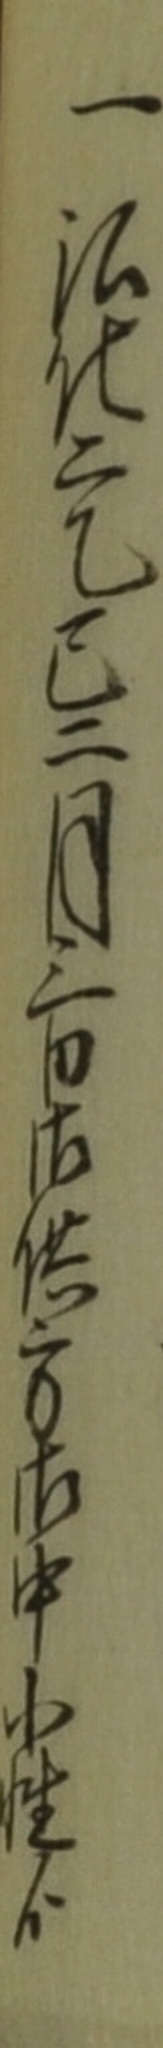一弘化二乙巳二月三日御供方御中小性ゟ
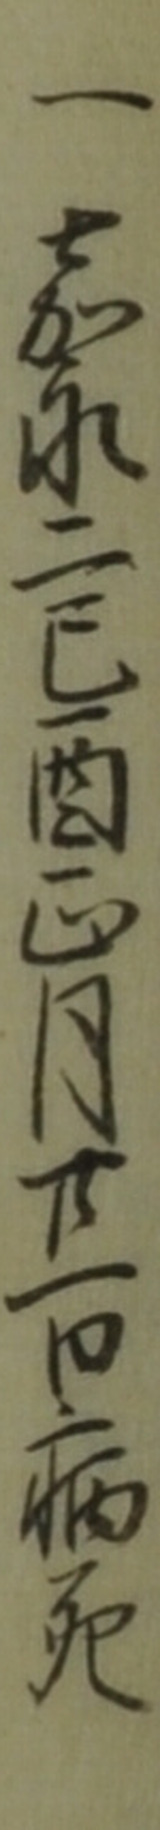一嘉永二己酉正月廿一日病死
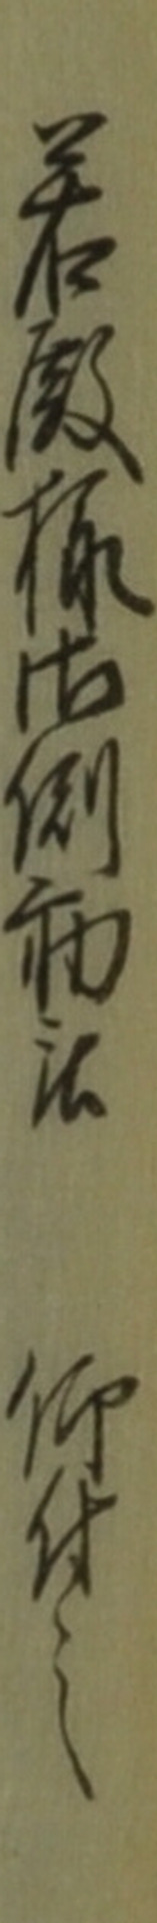若殿様御御側勤被仰付之
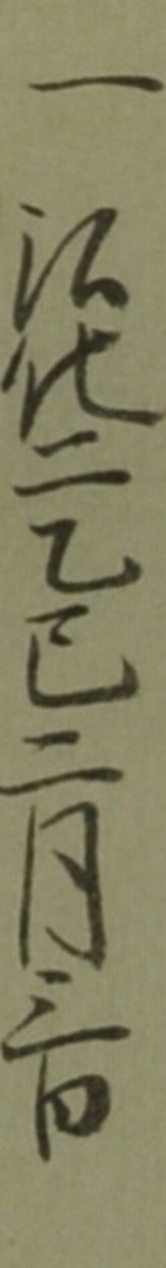一弘化二乙巳二月三日
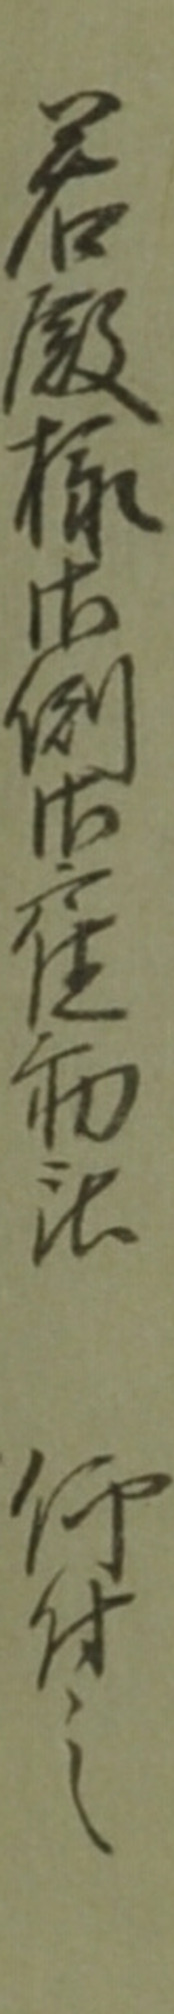若殿様御側御雇勤被仰付之
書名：諸御役代々録（五）
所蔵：伊那市立高遠町図書館・合同会社AMANE
